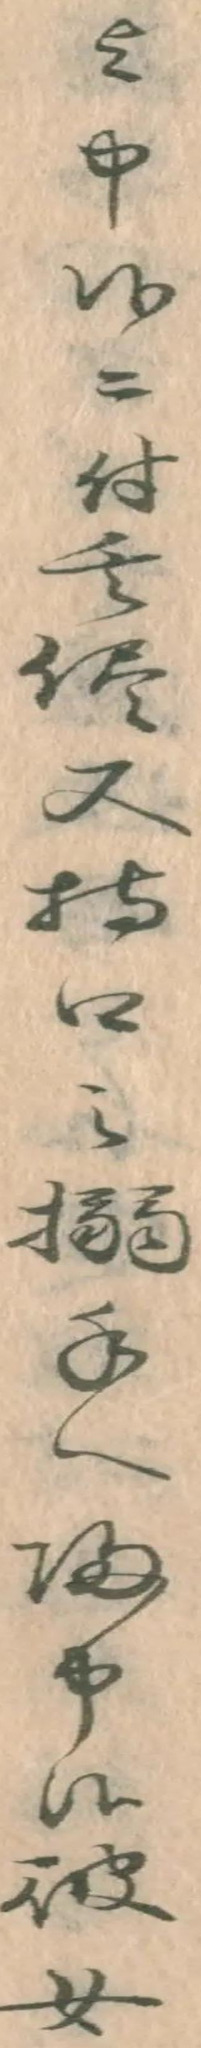与申候に付其侭又持口之搦手へ帰申候彼女
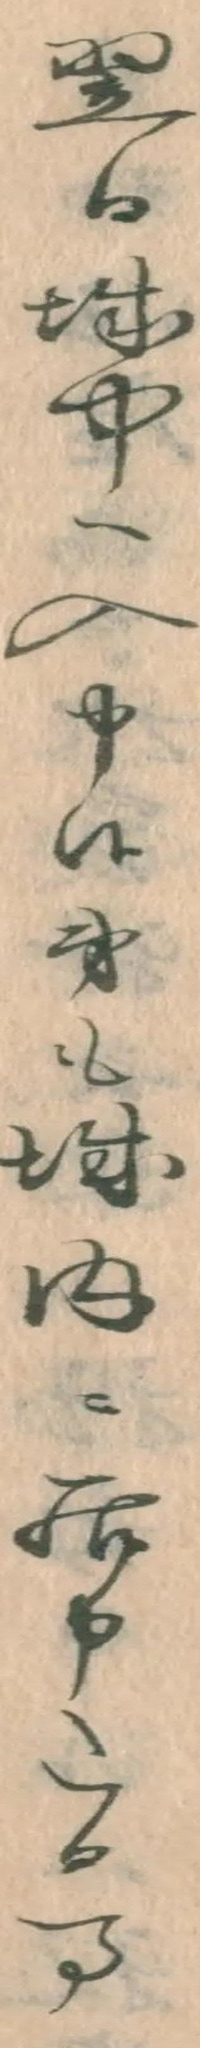翌日城中へ入申候弟も城内に居申たる事
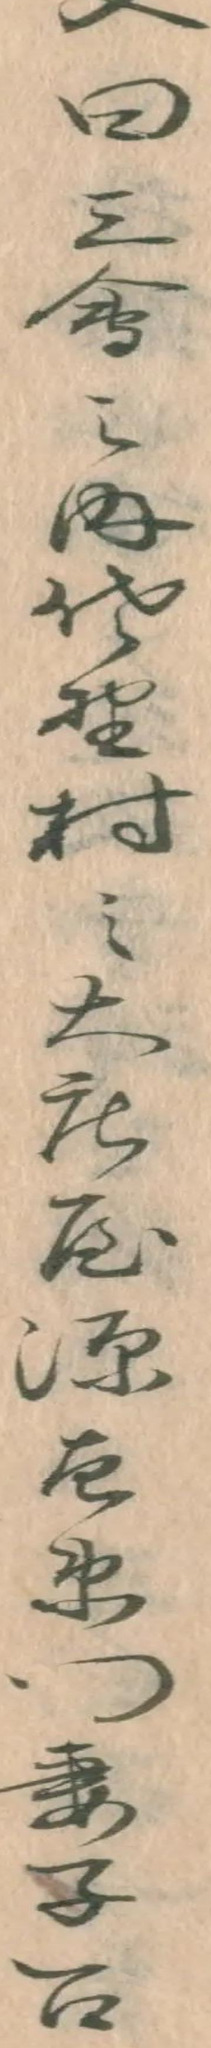又曰三会之内佐野村之大庄屋源左衛門妻子召
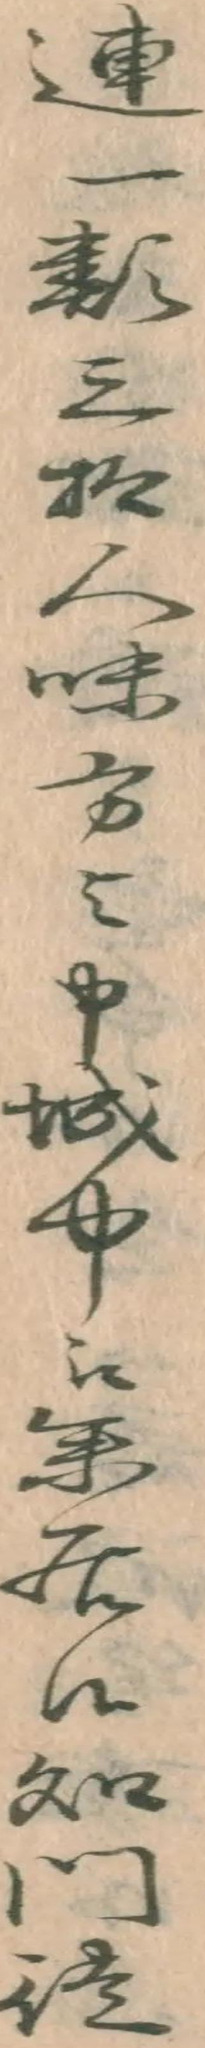連一類三拾人味方与申城中へ参居候処門徒
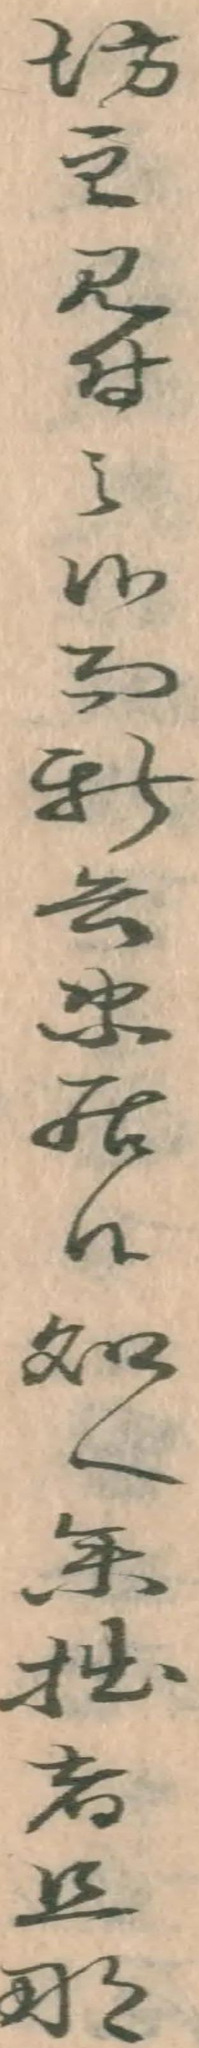坊主見付之候而新兵衛居候処へ参拙者旦那
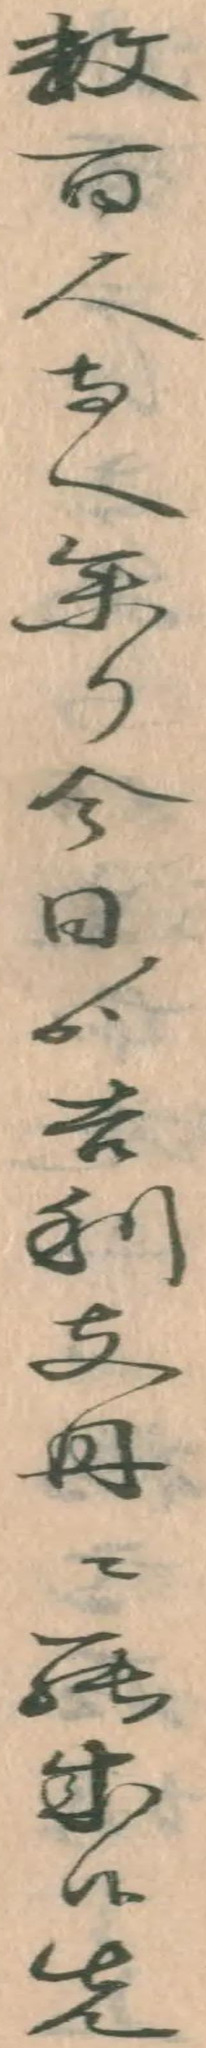数百人寺へ参り今日ゟ吉利支丹に罷成候先
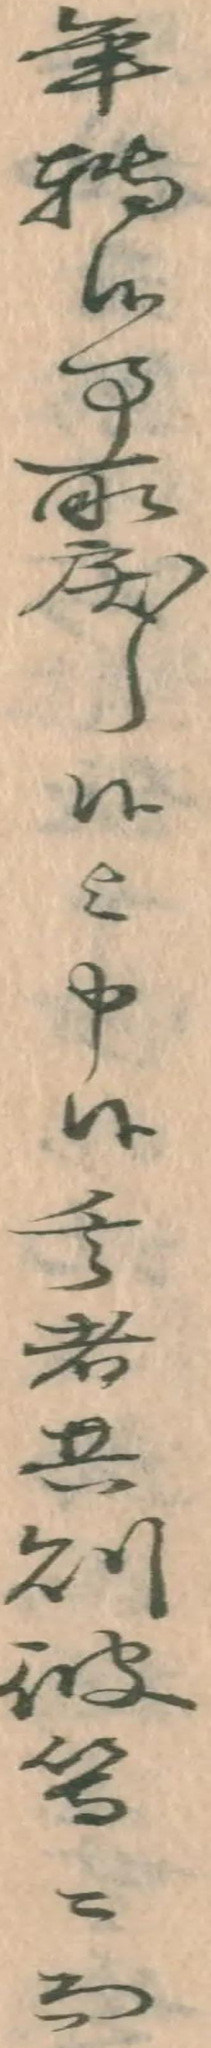年転候事取戻し候与申候其者共即彼等に而
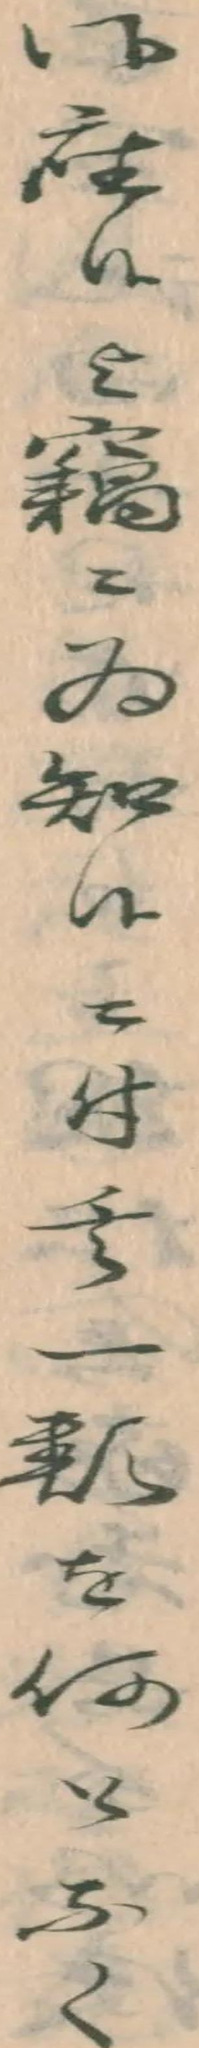御座候与密にゐ知候に付其一類を何となく
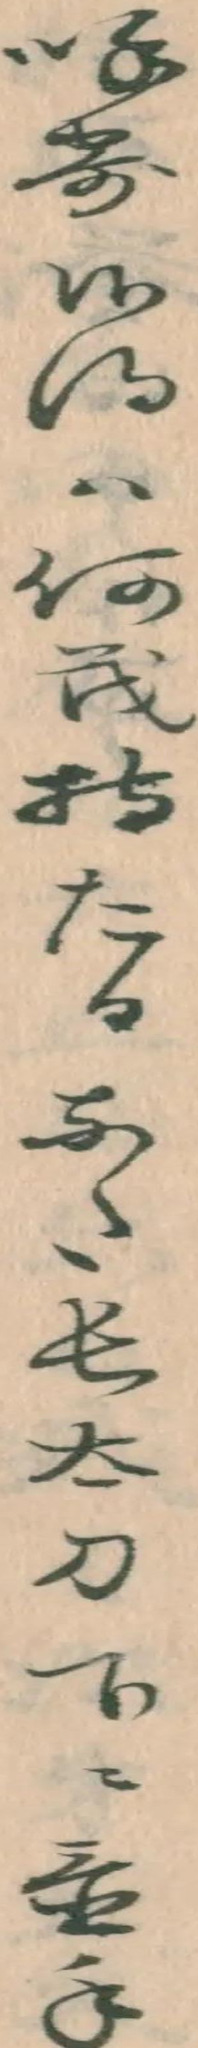呼寄候得は何茂持たるなた長太刀下に置手
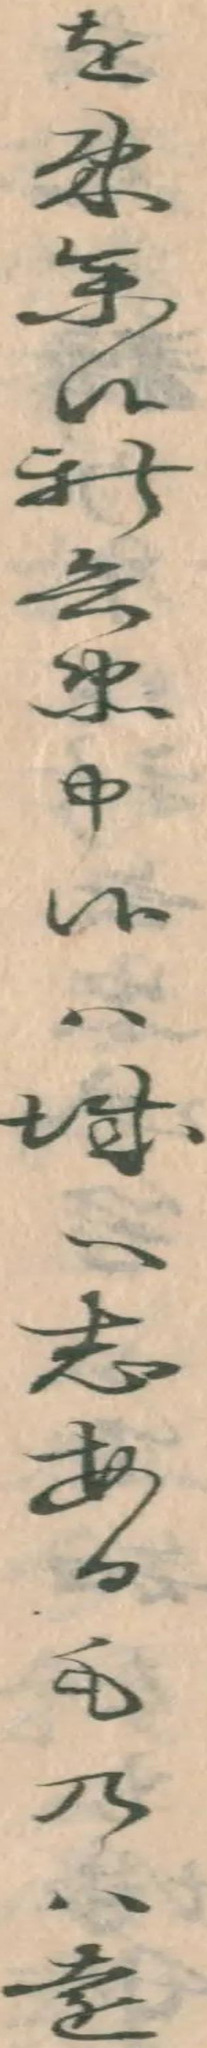を束参候新兵衛申候は城へ志あるも乃は遠
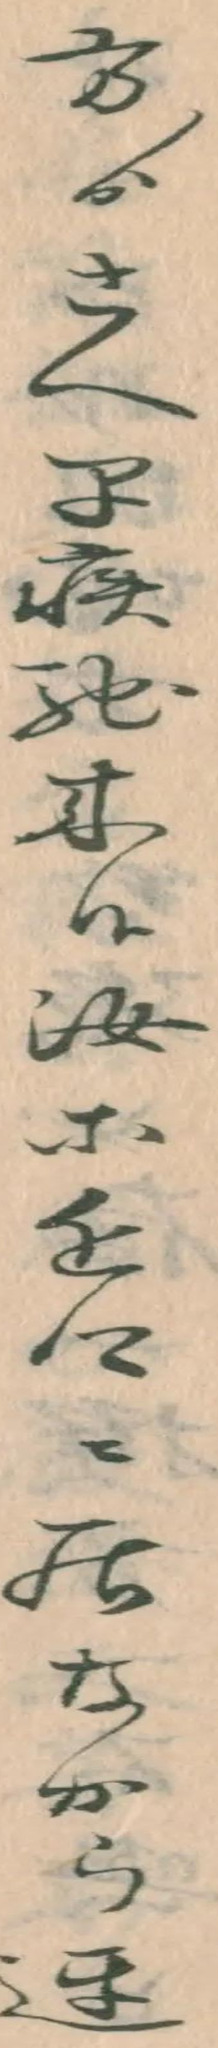方ゟさへ早疾馳来候汝等近郷に居なから遅
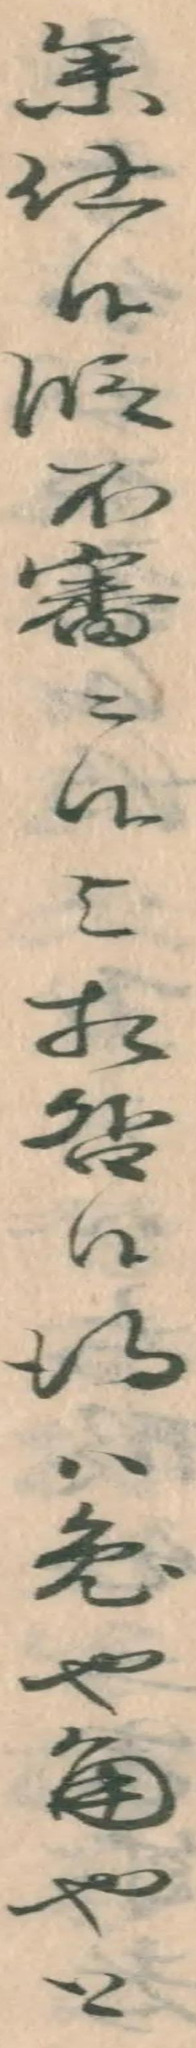参仕候段不審に候与相咎候得は兎や角やと
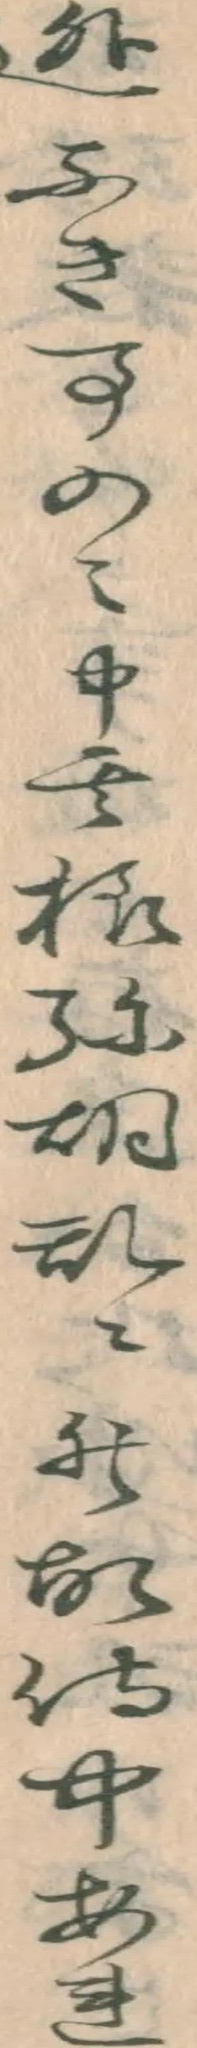逃なき事のみ申其様弥胡乱に升故侍中あ連
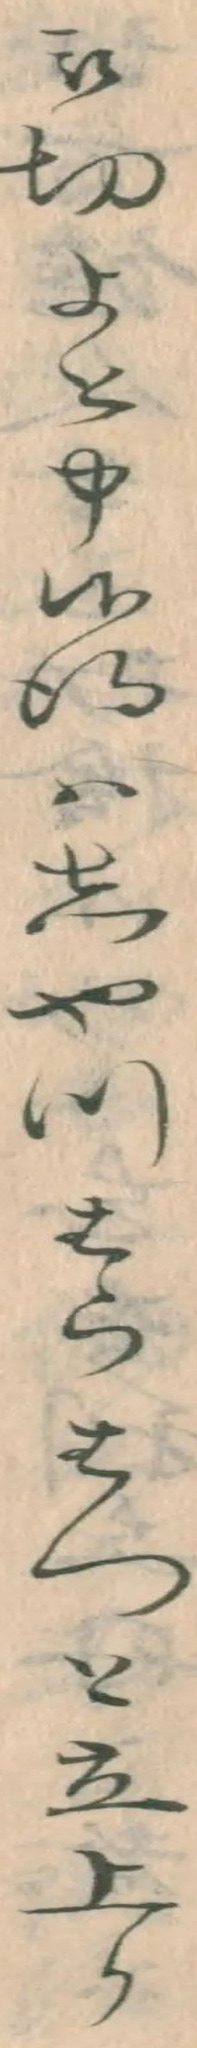被切よと申候得は志や川はらはつと立上り
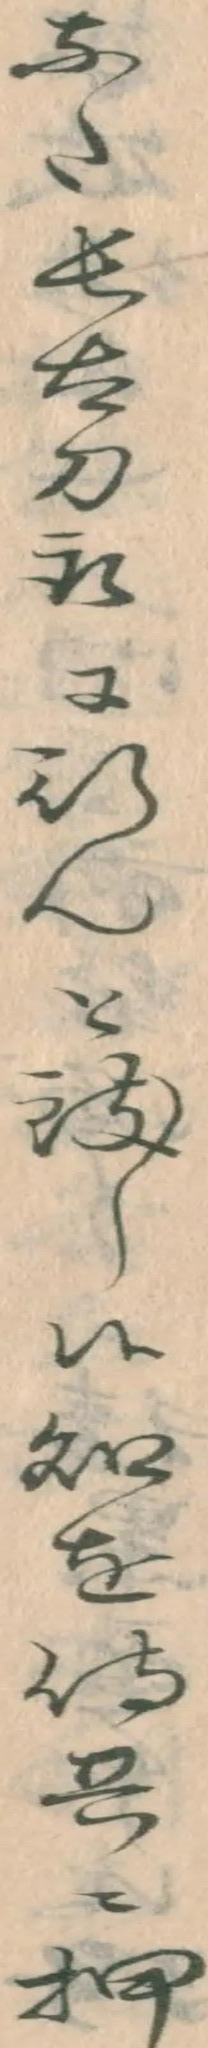なた長太刀取尓行んと致し候処を侍共に押
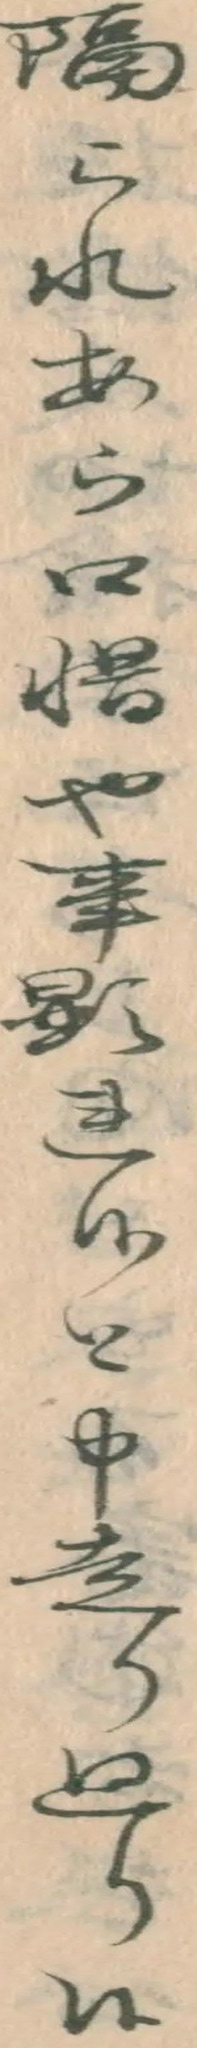隔られあら口惜や事顕連候と申走り廻り候
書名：切支丹御退治記 49巻. [2]
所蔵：国立国会図書館 National Diet Library, JAPAN
